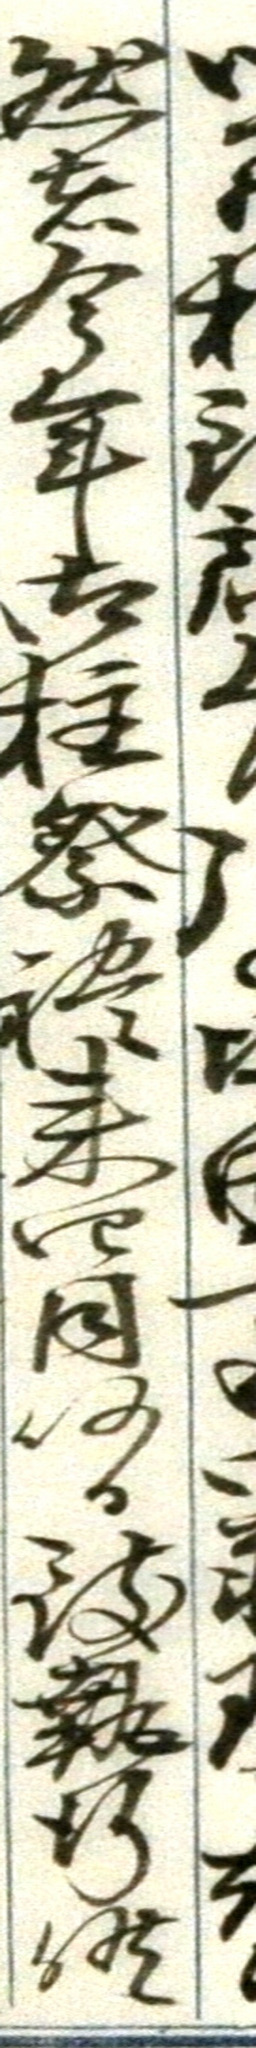然は今年御柱祭礼来四月何日致執行候
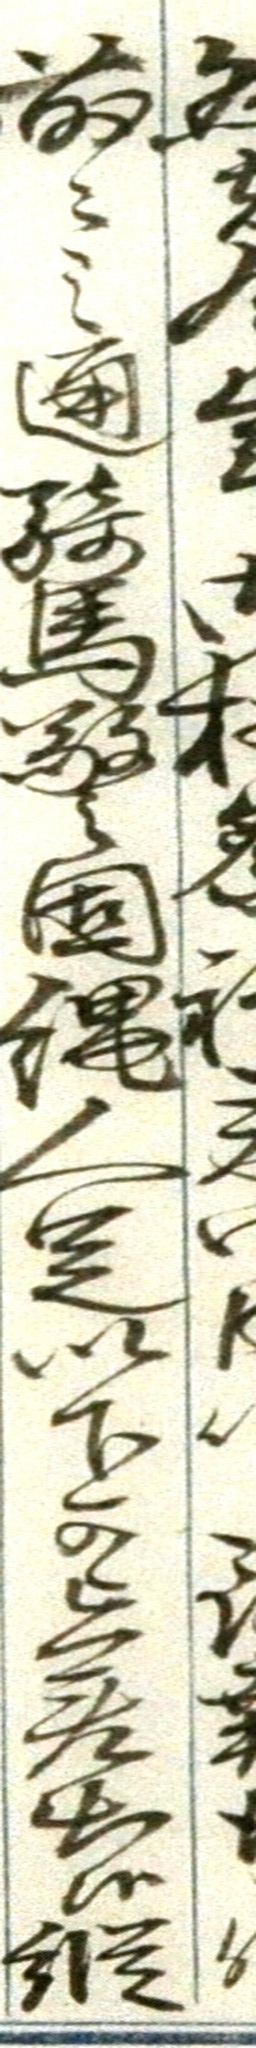前々之通騎馬警固縄人足以下可被差出候縦
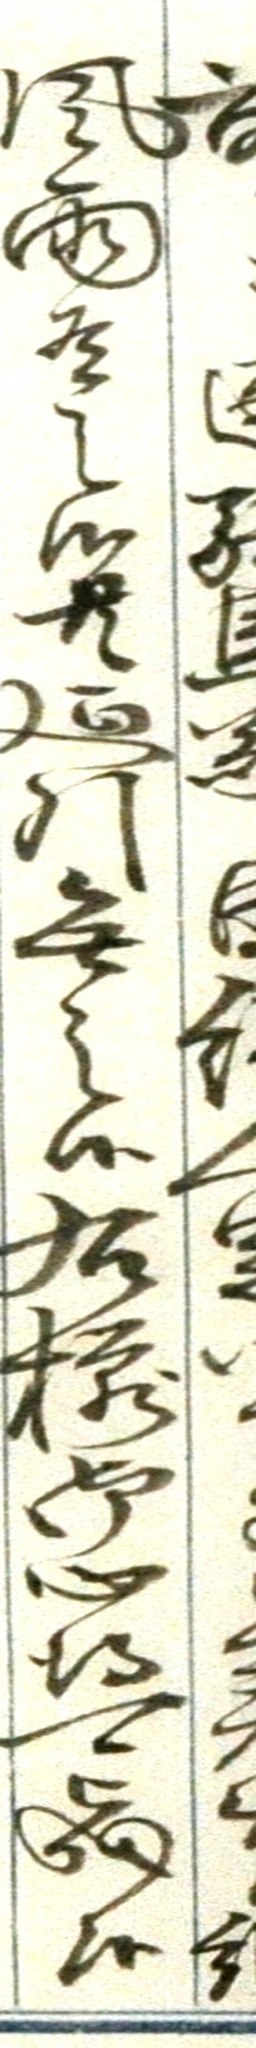風雨有之候共延引無之候右様御心得可被成候
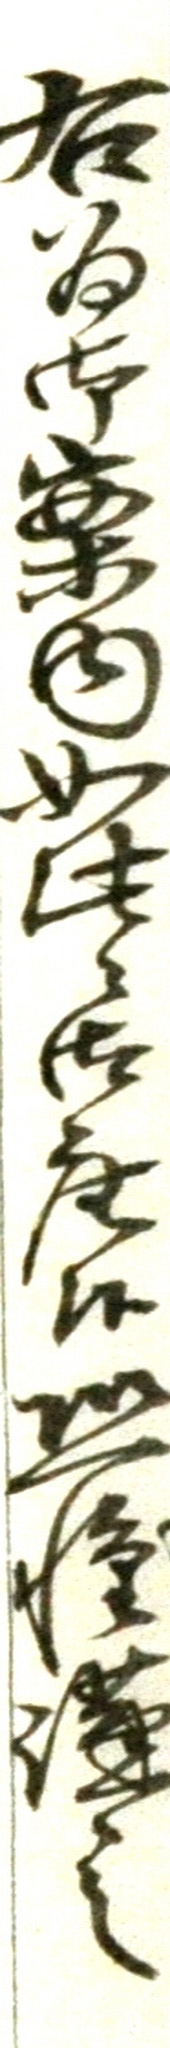右為御案内如此ニ御座候恐惶謹言

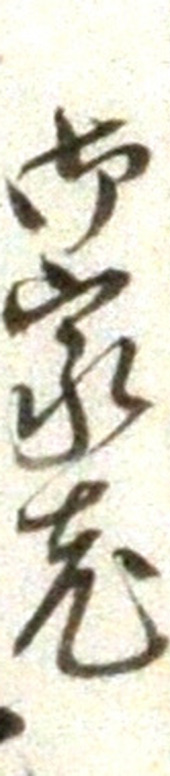御家老
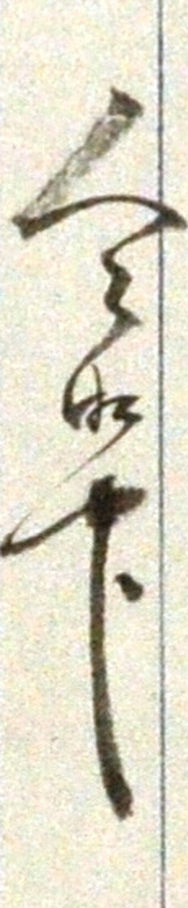人々御中
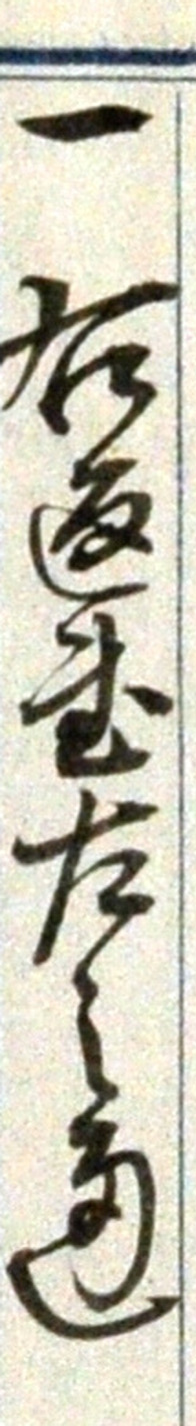一右返書左之通
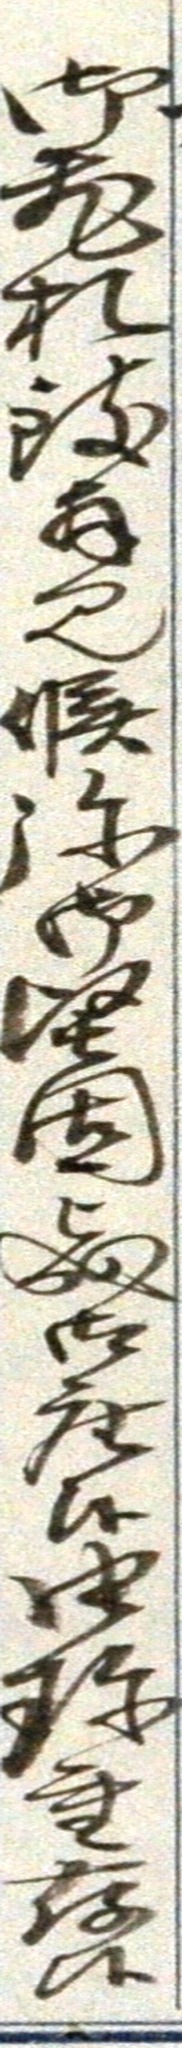御飛札致拝見候弥御堅固被成御座候由珎重存候
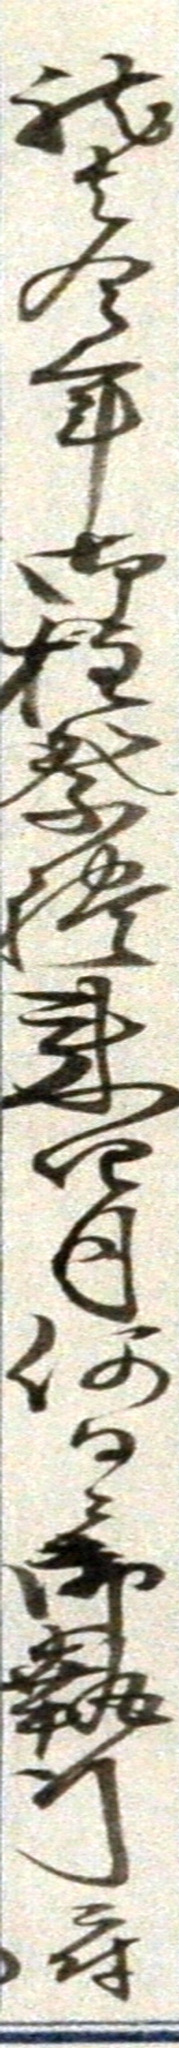然は今年御柱祭礼来四月何日ニ御執行ニ付
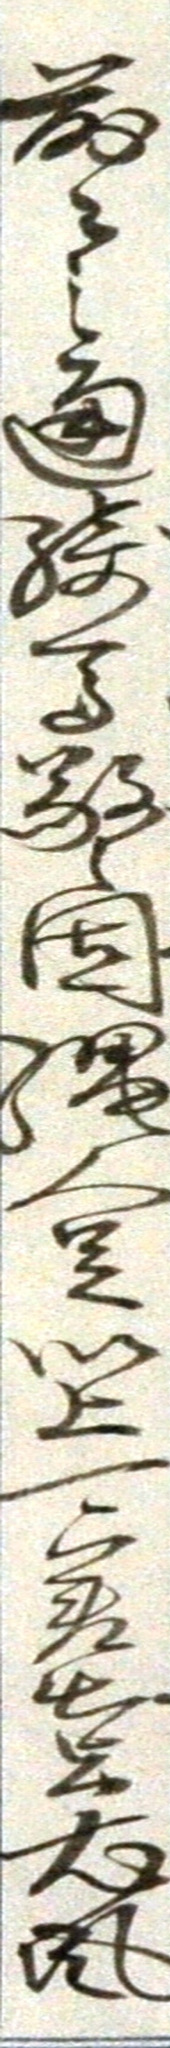前々之通騎馬警固縄人足以上可被差出旨尤風
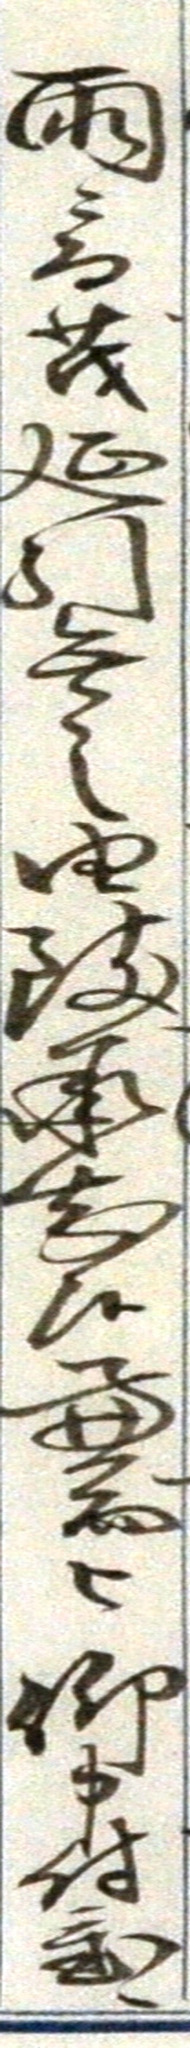雨ニ而も延引無之由致承知候兼而被仰申付置候
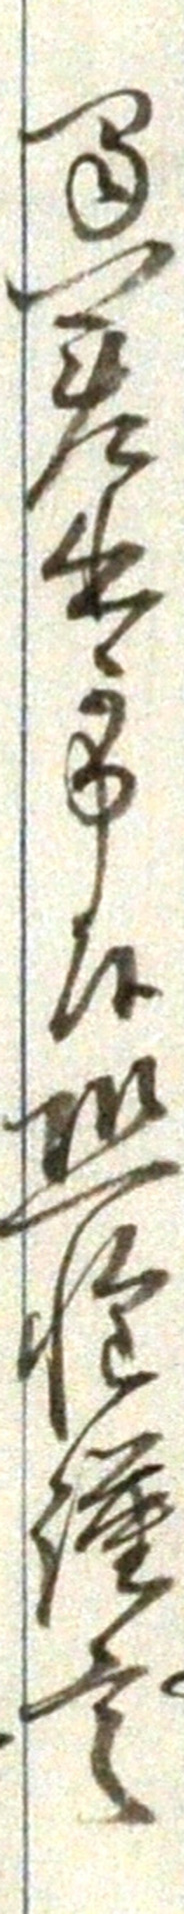間差出可申候恐惶謹言
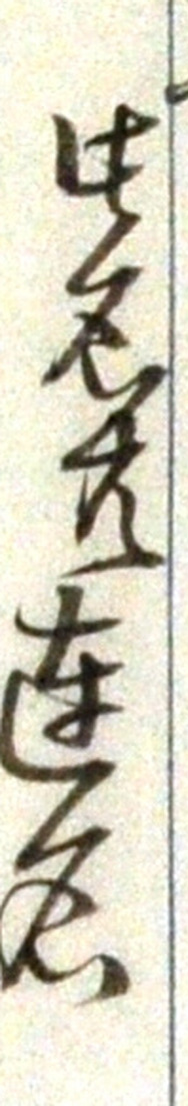此名共連名
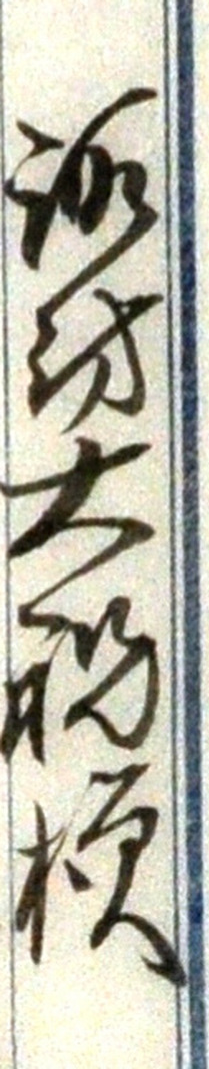諏訪大祝様
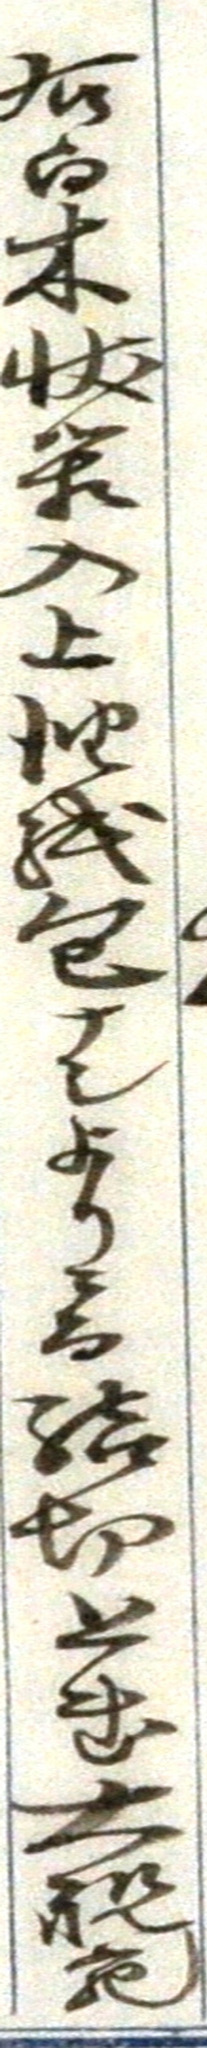右白木状箱入上油紙包ナシよりニ而結切上書大祝宛
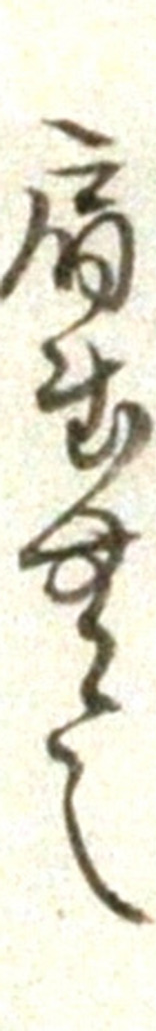肩書無之
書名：諏訪御柱祭之節・騎馬大将御中間頭・御柱引人足
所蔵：伊那市立高遠町図書館・合同会社AMANE
